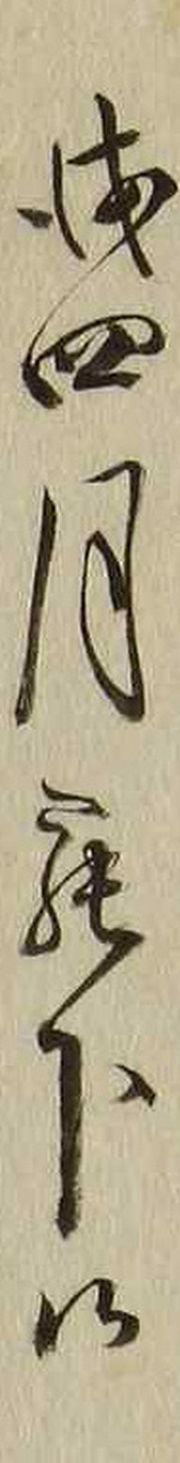戌四月罷下候
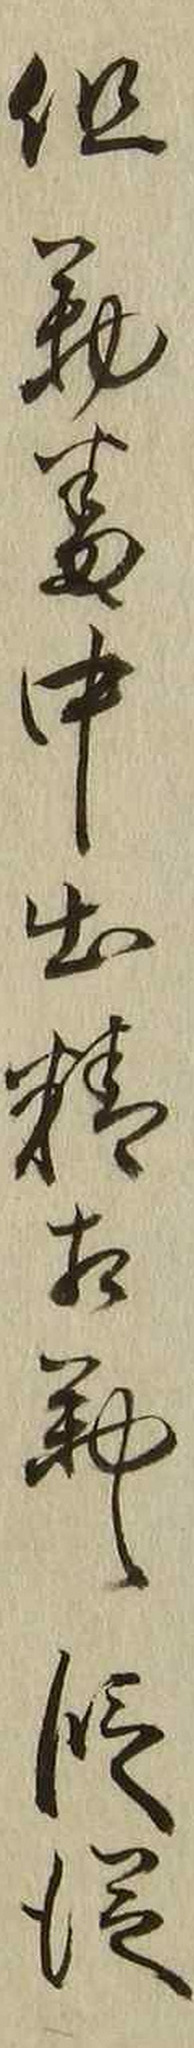但勤番中出精相勤候段従
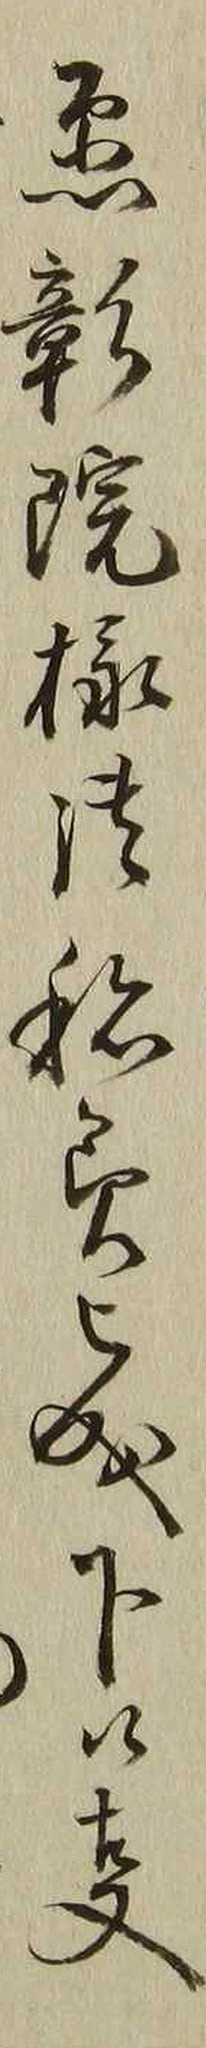愿彰院様御称美被成下候事
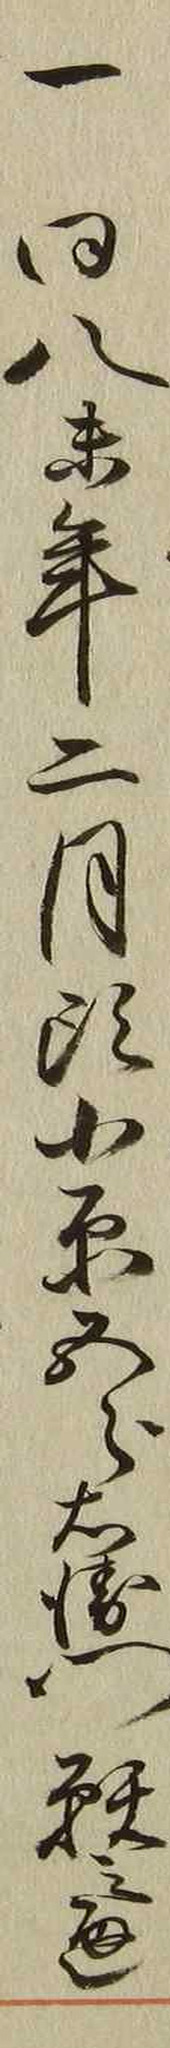一同八未年二月頭小原五郎右衛門願之通
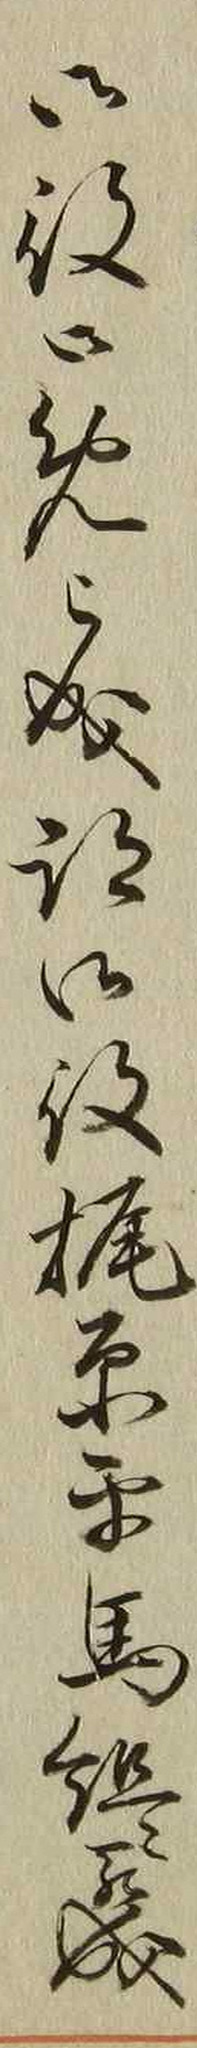御役御免被成跡御役梶原平馬組ニ罷成
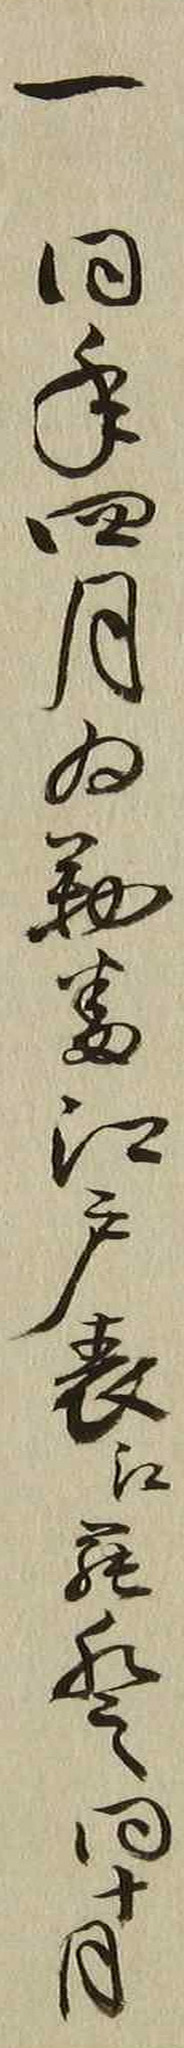一同年四月為勤番江戸表江罷登同十月
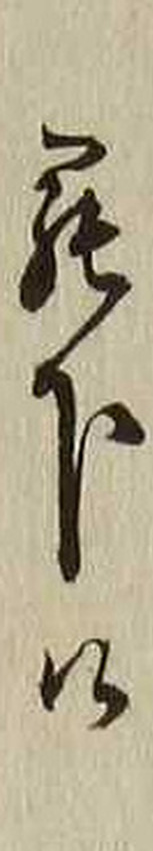罷下候
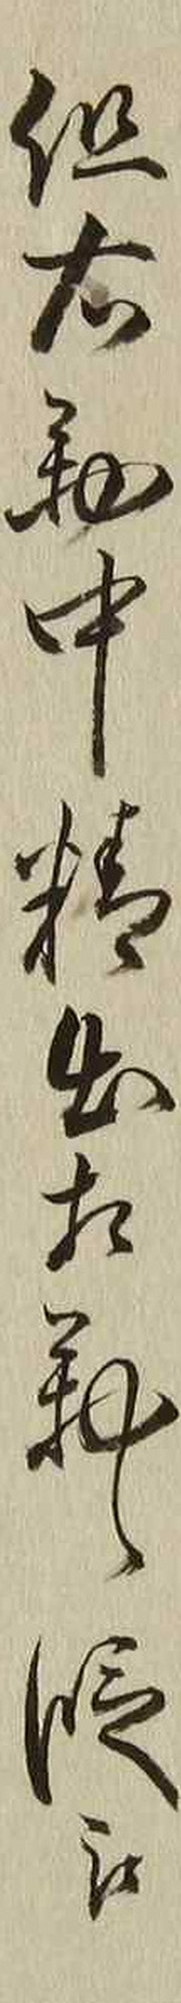但右勤中精出相勤候段被
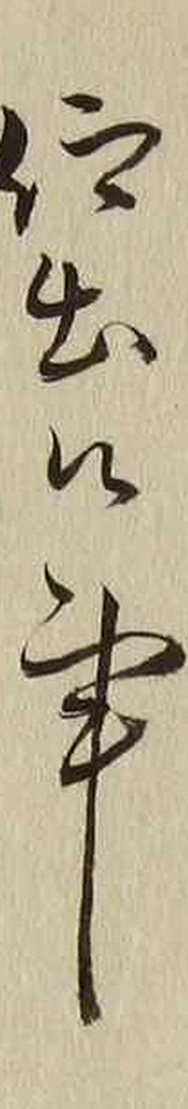仰出候事
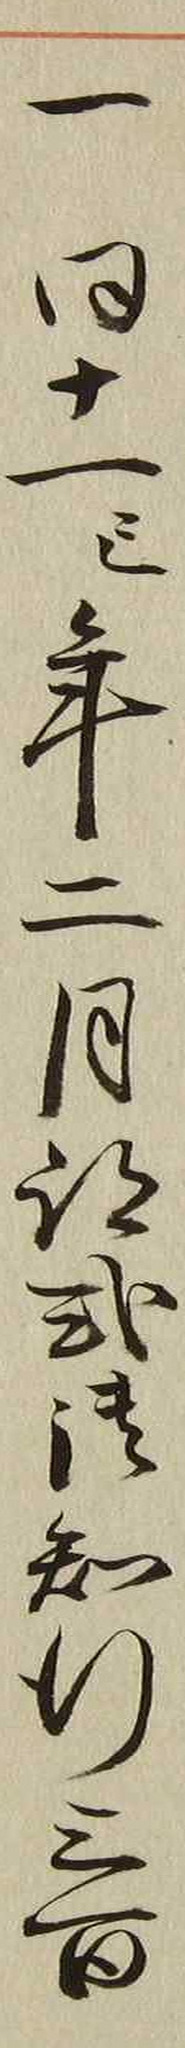一同十一巳年二月跡式御知行三百
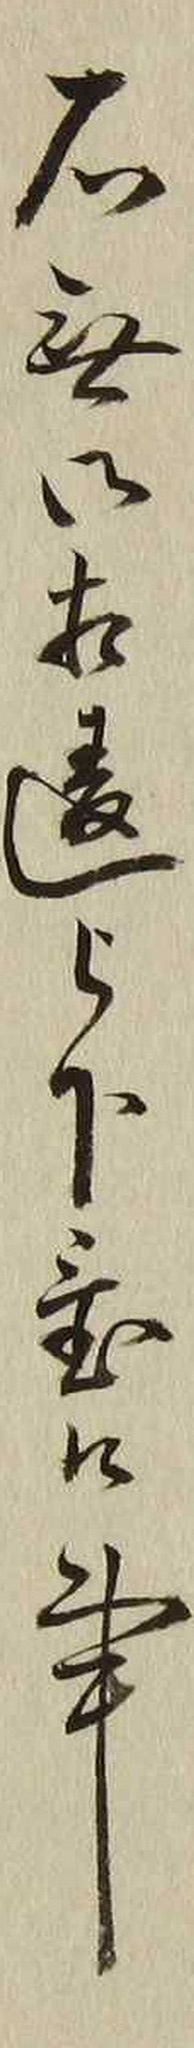石無御相違被下置候事
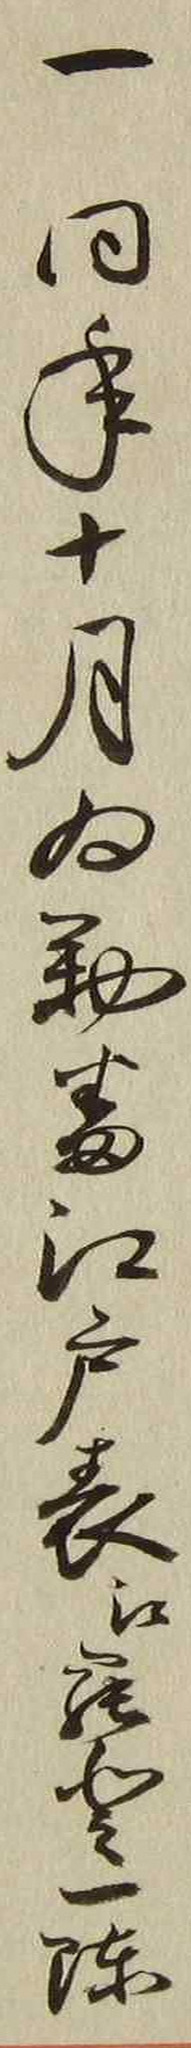一同年十月為勤番江戸表江罷登一陣
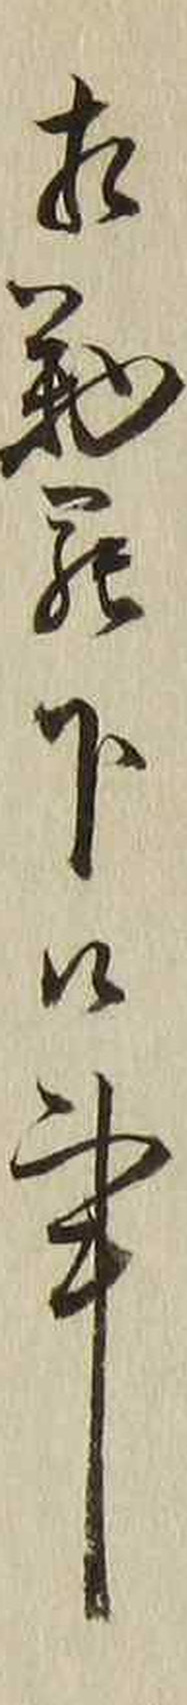相勤罷下候事
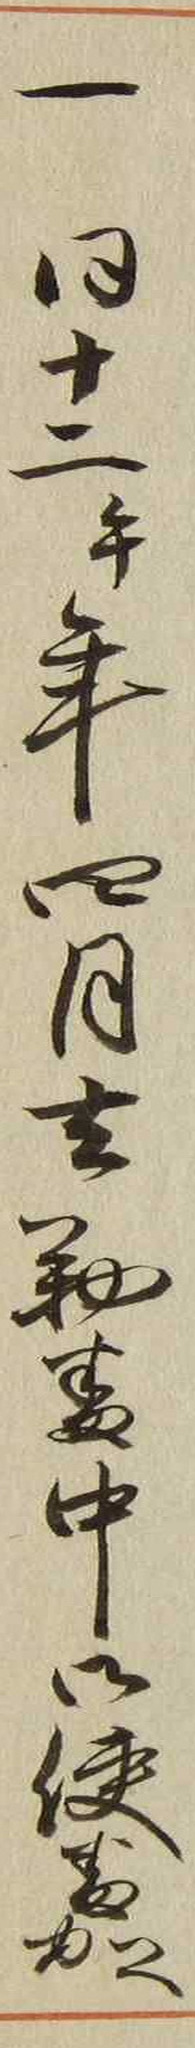一同十二午年四月去勤番中御使番加
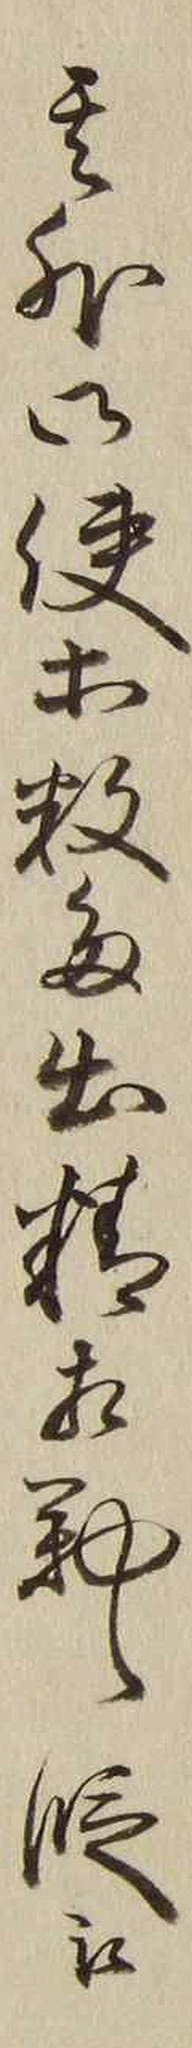其外御使等数多出精相勤候段被
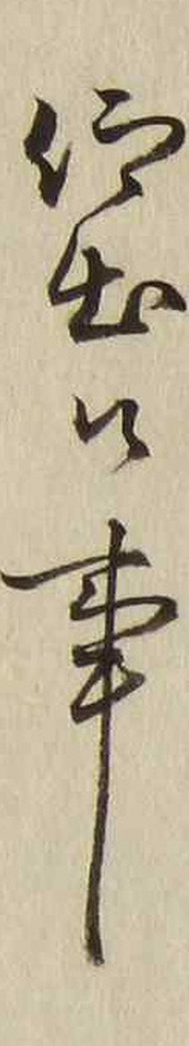仰出候事
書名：諸士系譜　巻之60　と之部3
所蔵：会津若松市立会津図書館
